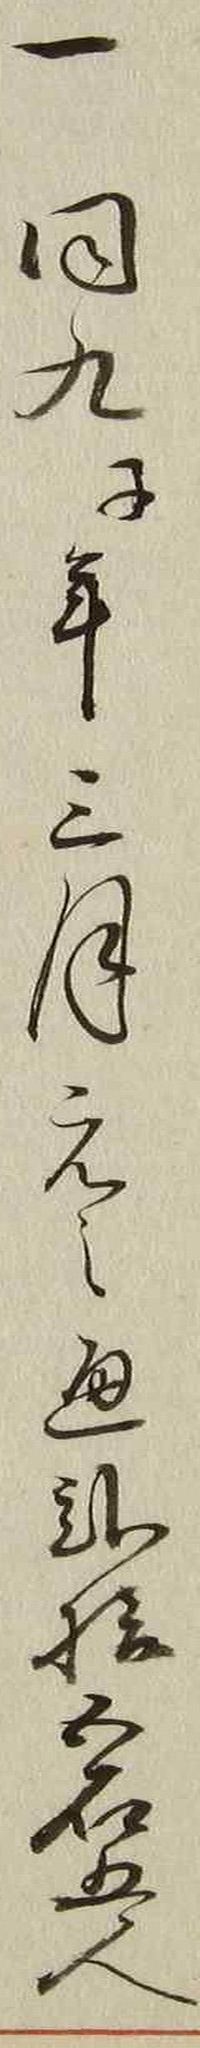一同九子年三月元之通弐拾五石五人
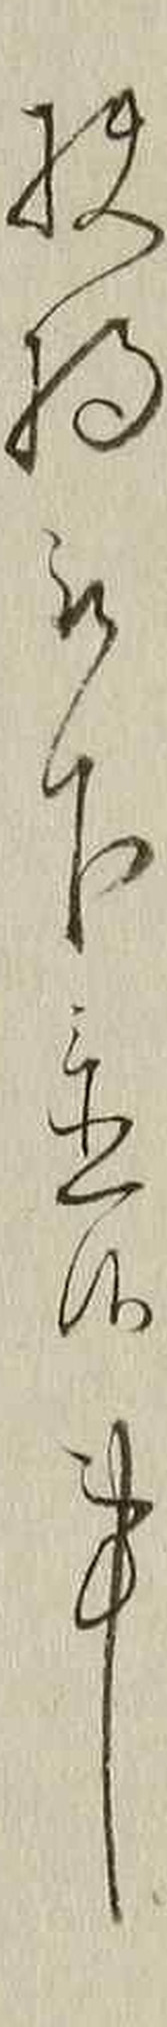扶持被下置候事
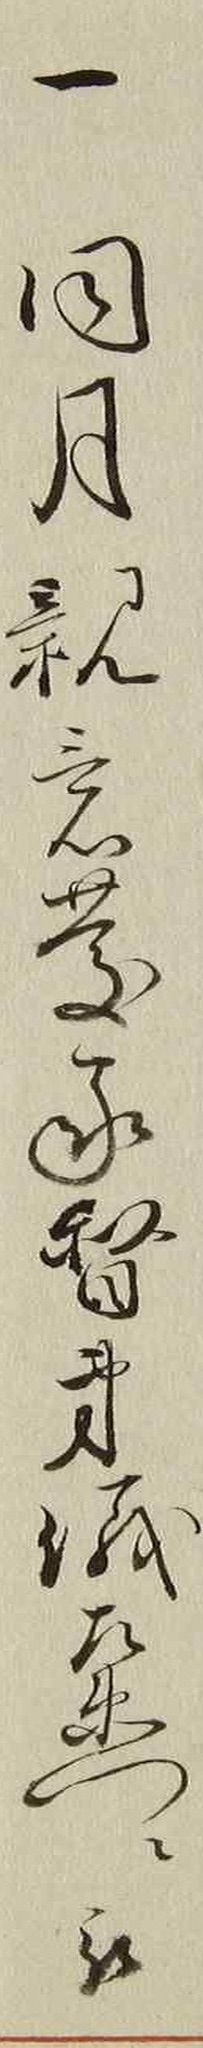一同月親意慶家督弟儀左衛門ニ被
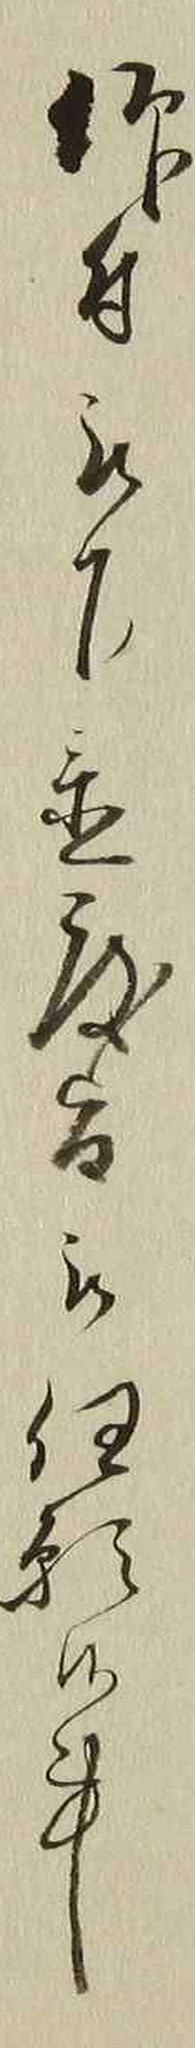仰付被下置度旨被任願候事
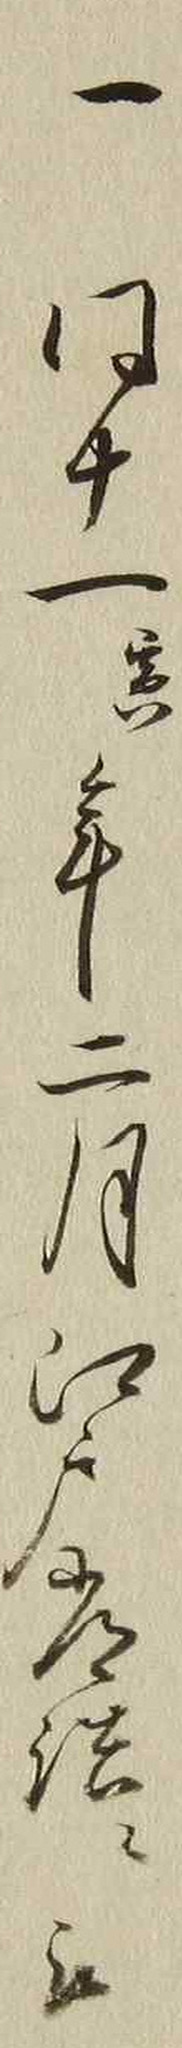一同十一寅年二月江戸常詰ニ被
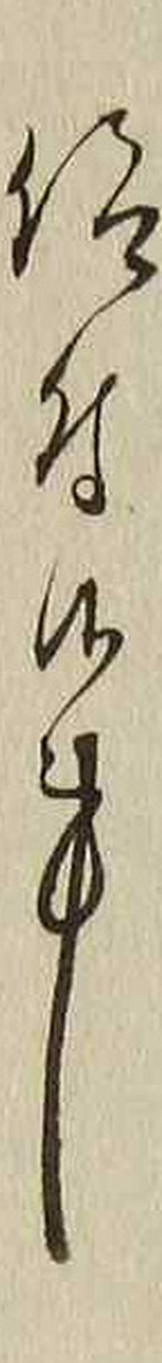仰付候事
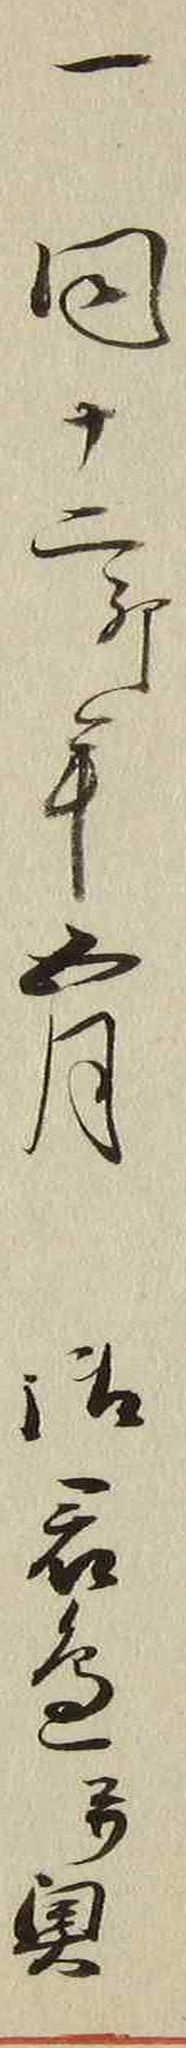一同十二卯年五月御君辺并奥
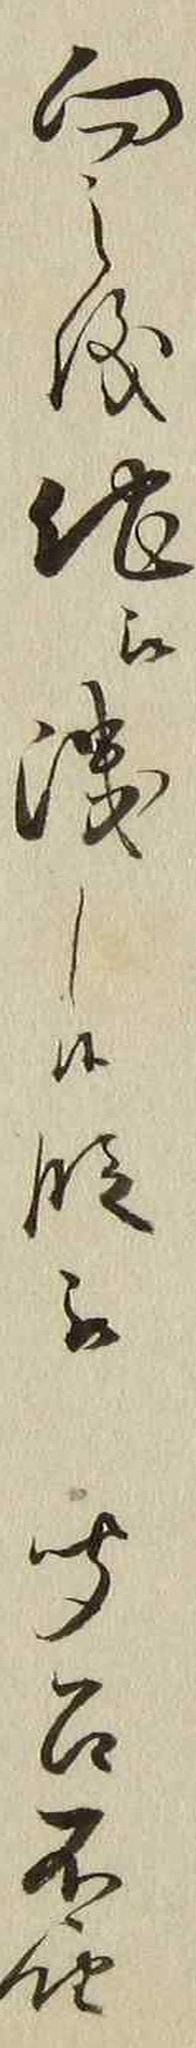向之儀他江洩し候段被聞召不届
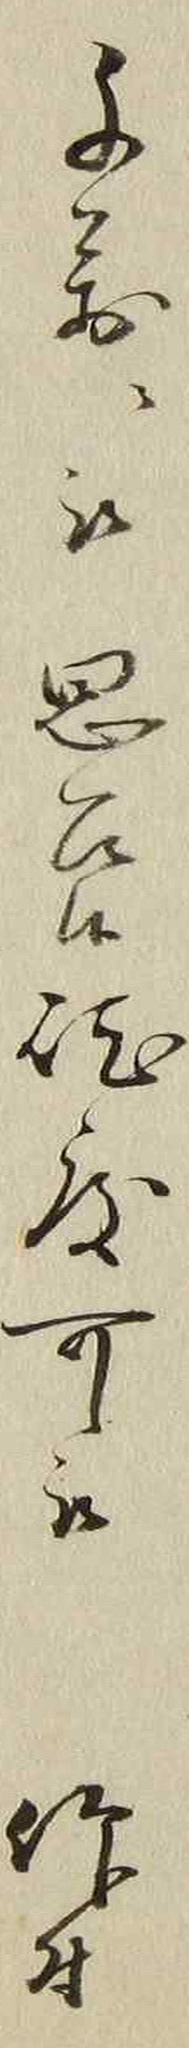千万ニ被思召候訖度可被仰付
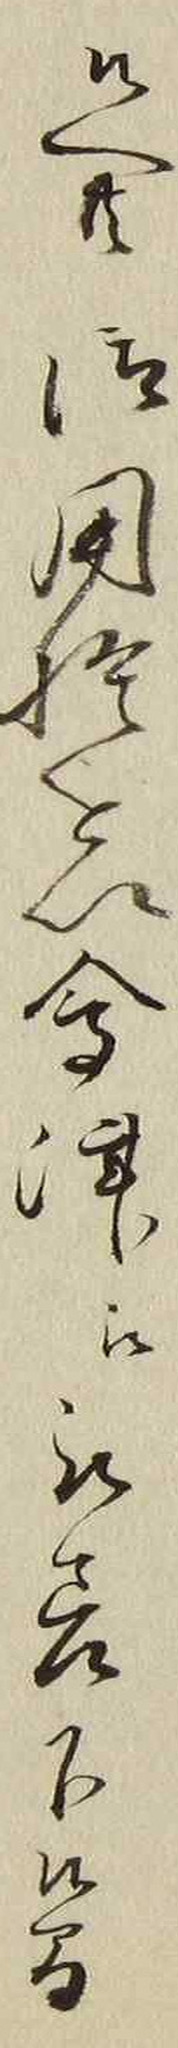候へ共御用捨を以会津江被差下候間
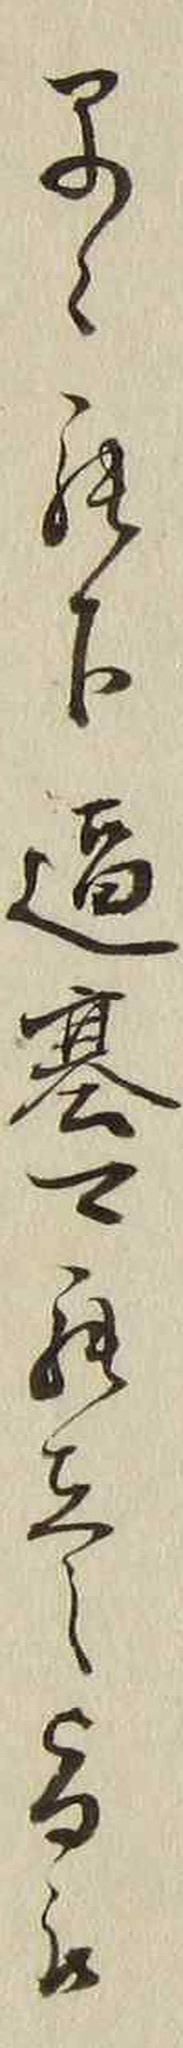早々罷下逼塞可罷在之旨被
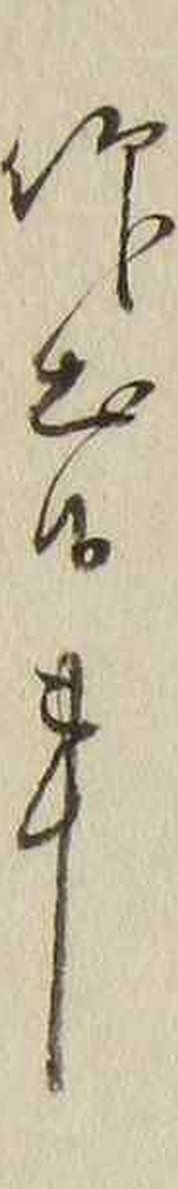仰出候事
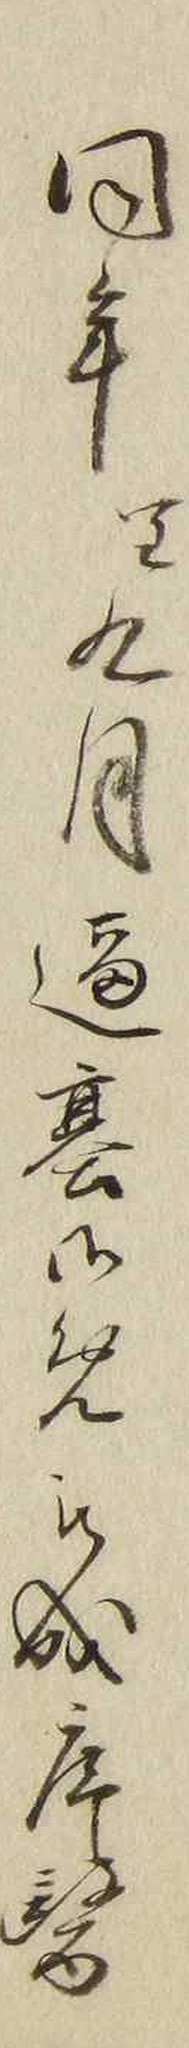一同年閏九月逼塞御免被成序医

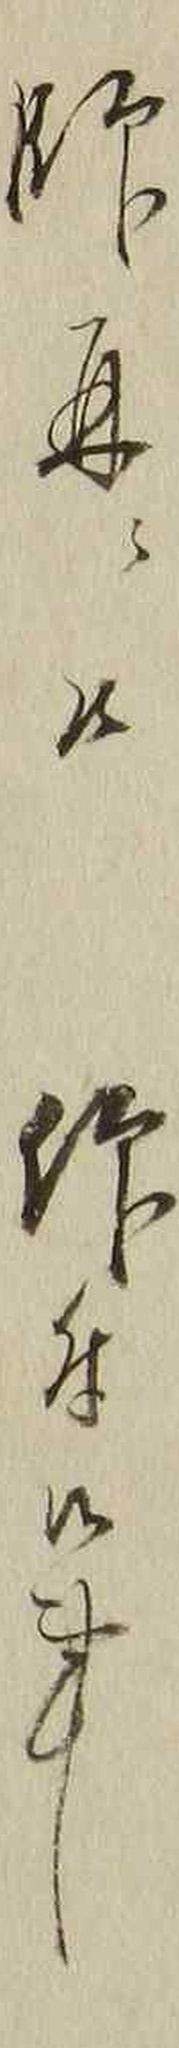師再ニ被仰付候事
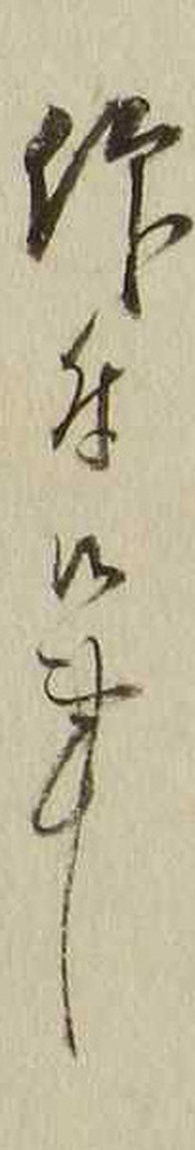仰付候事
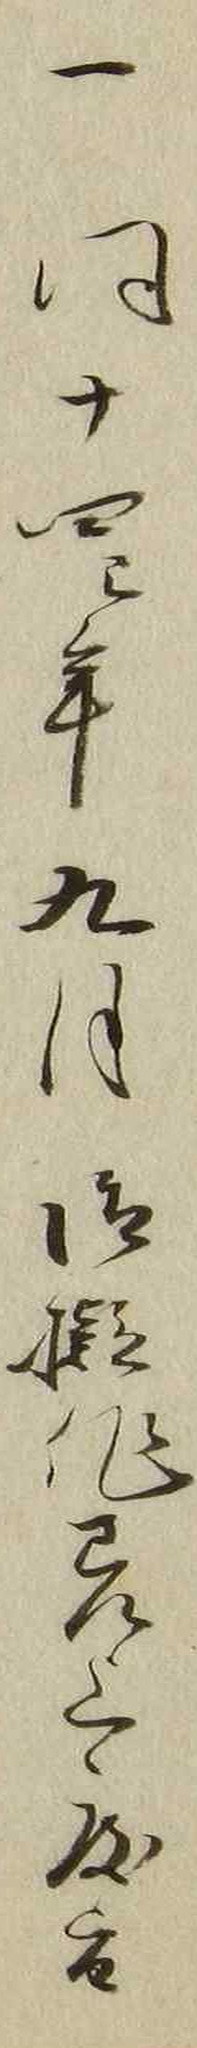一同十四巳年九月御擬作差上候度旨
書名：諸士系譜　巻之26　い之部26
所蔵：会津若松市立会津図書館
